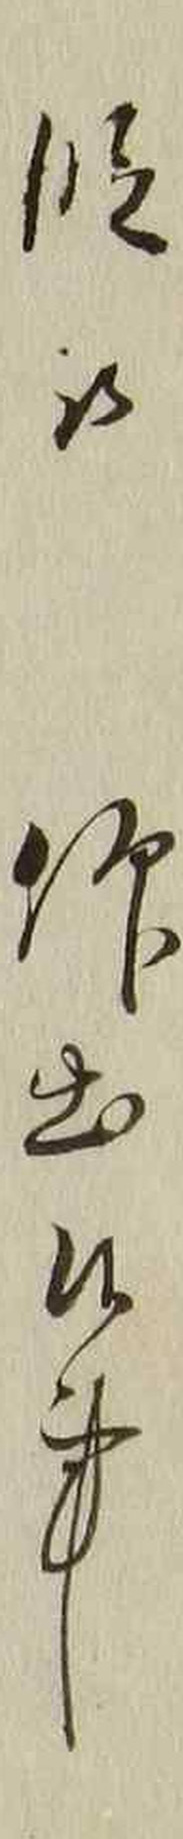段被仰出候事
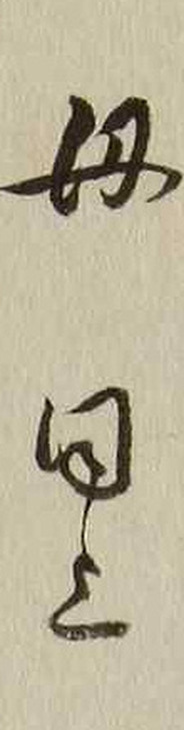母同上
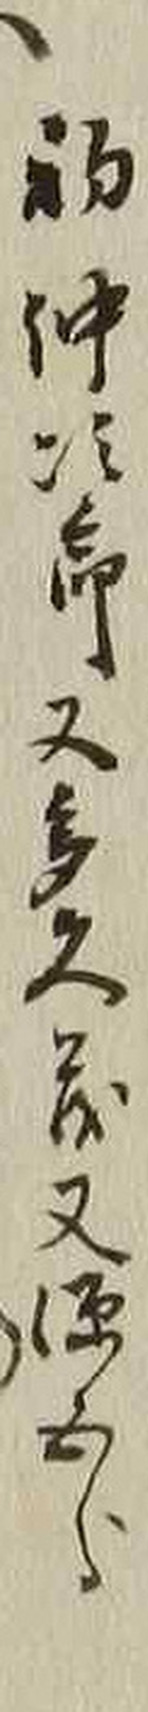初仲次郎又多久茂又源五郎
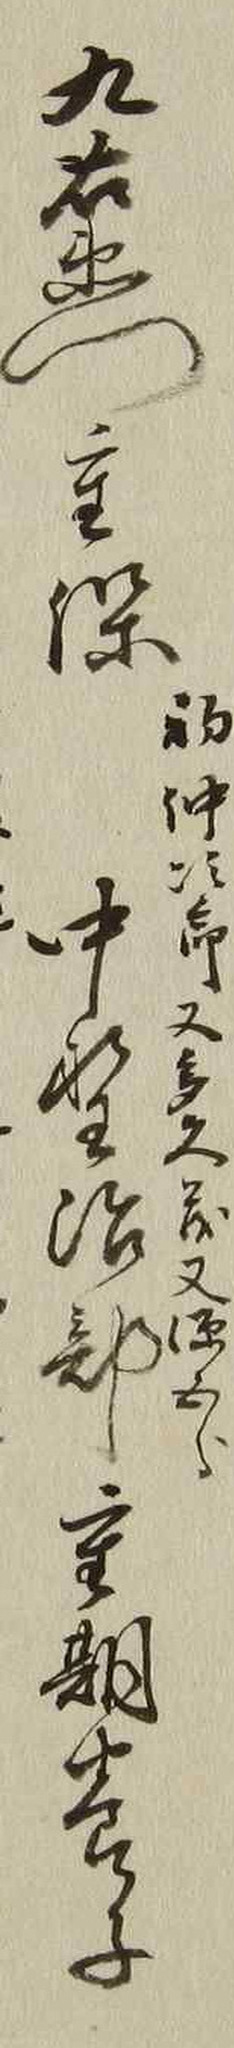九右衛門重保中野治部重期養子
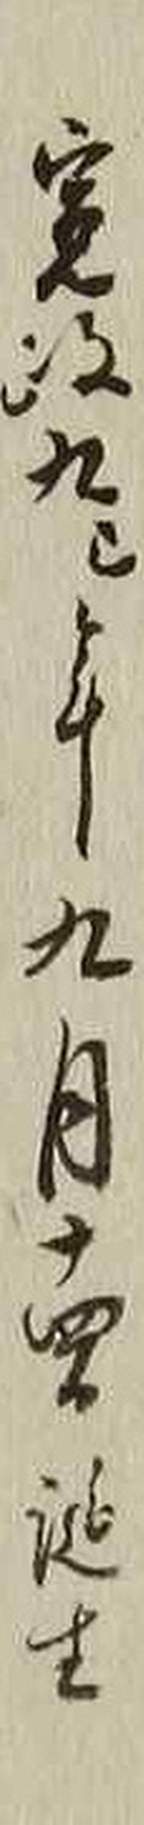寛政九巳年九月十四日誕生
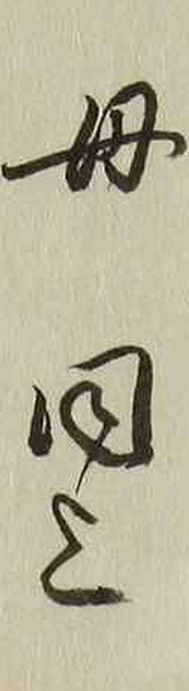母同上
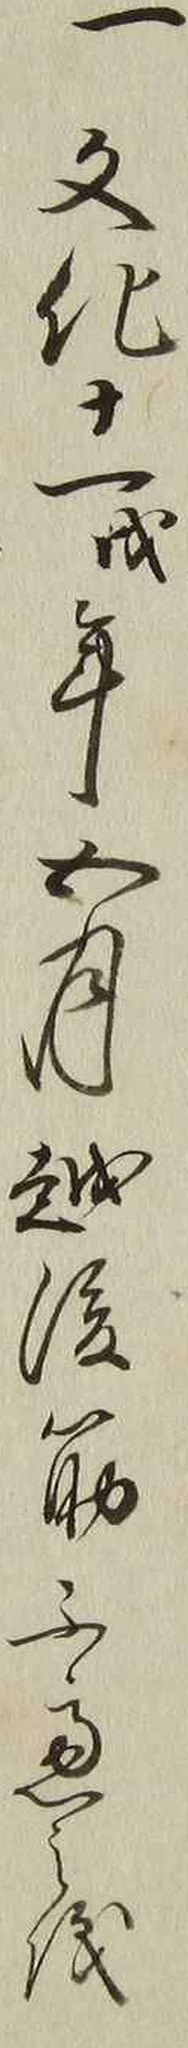一文化十一戌年五月越後筋不慮之儀
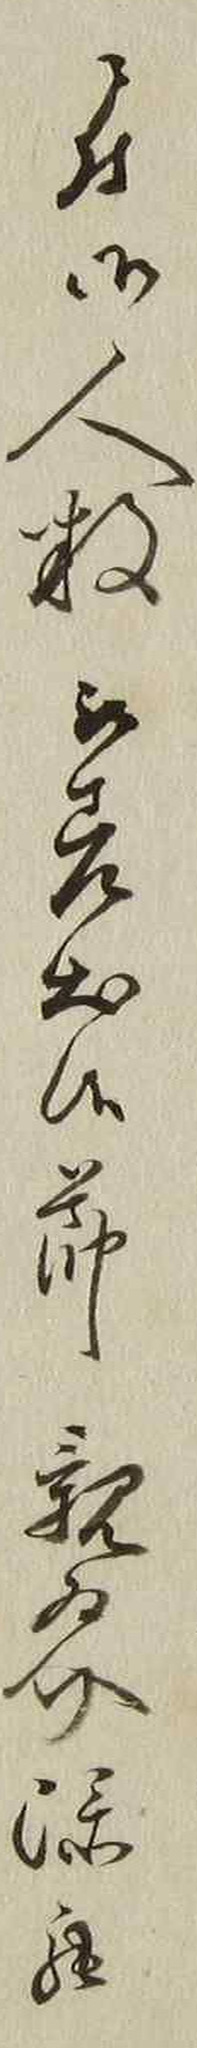ニ付御人数被差出候節親為介添罷
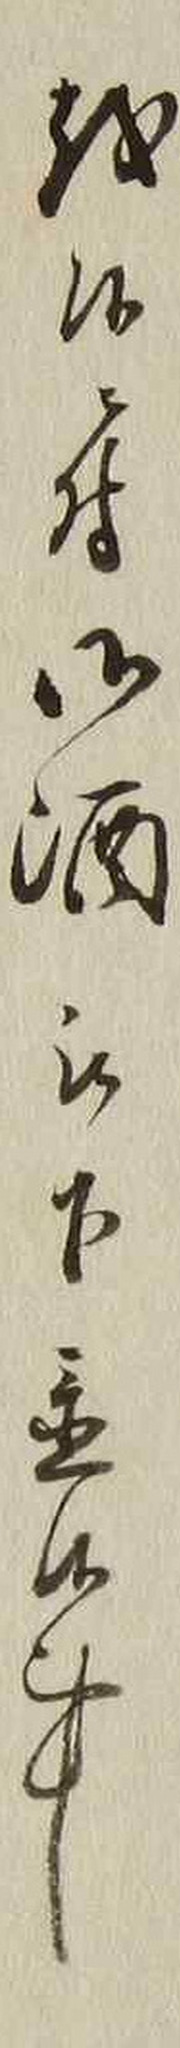越候ニ付御酒被下置候事
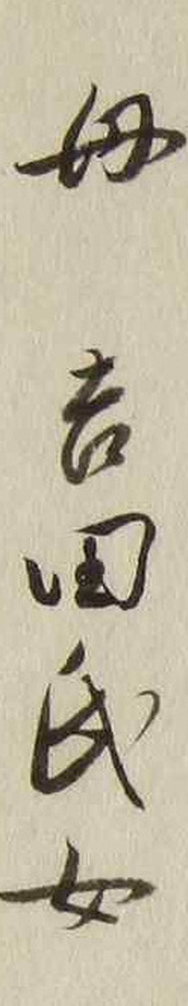母吉田氏女

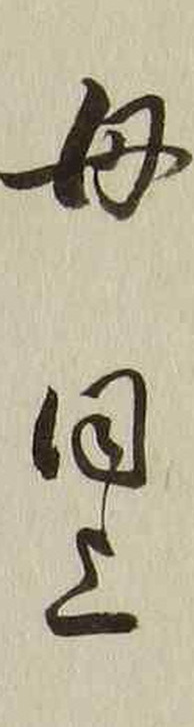母同上
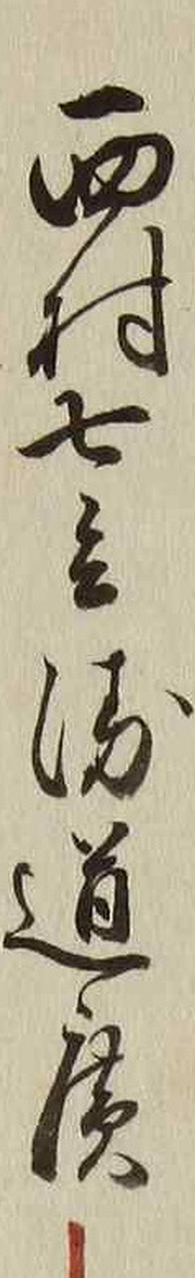西村七兵衛道広
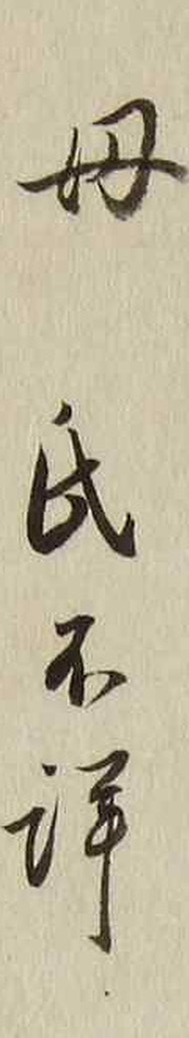母氏不詳
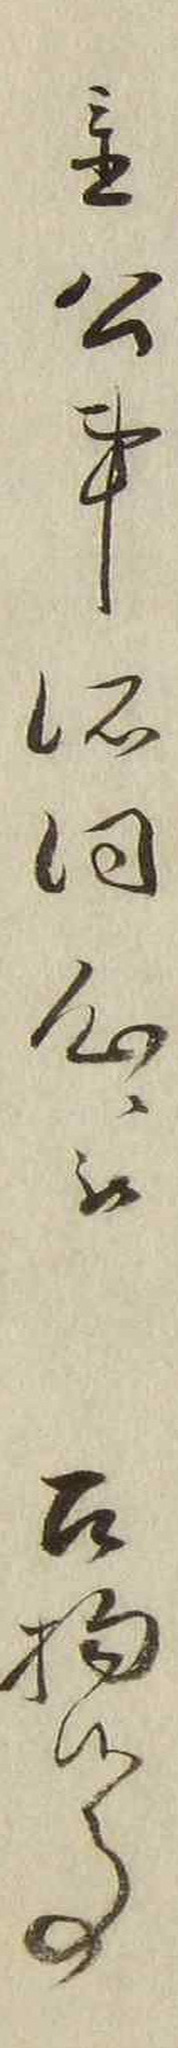置公事所同心ニ被召抱候事

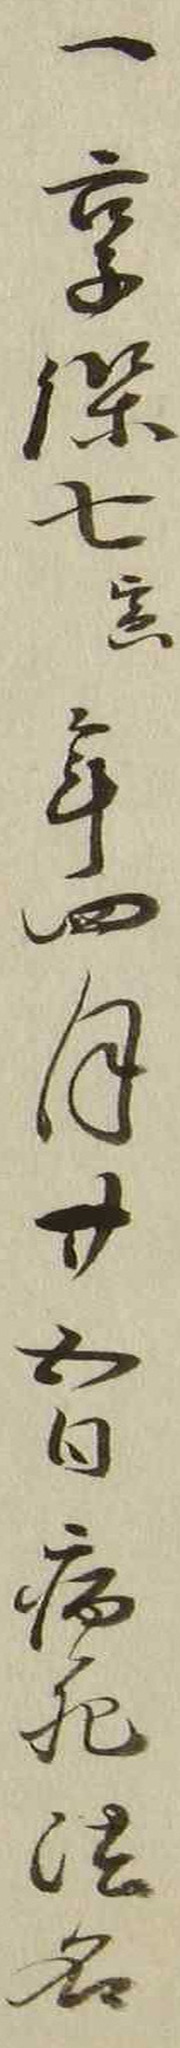一享保七寅年四月廿五日病死法名
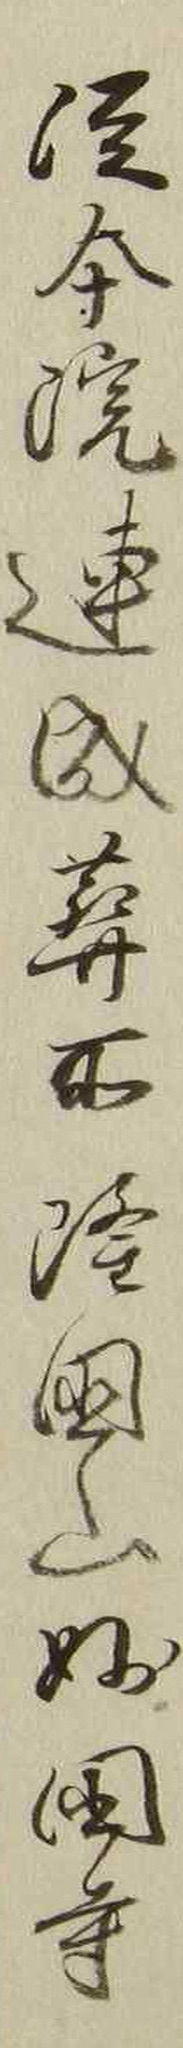従夲院連成葬所隆国山妙国寺
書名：諸士系譜　巻之52　に之部3
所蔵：会津若松市立会津図書館
